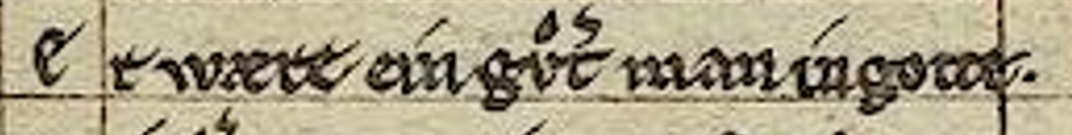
Er w[ae]re ein gv°ot(er) man in gotte.
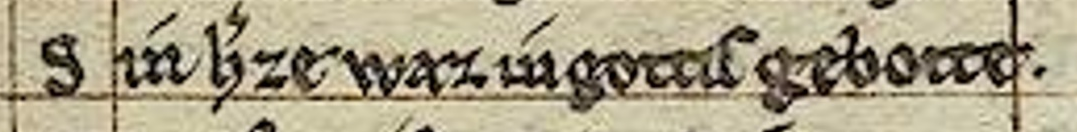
Sin h(er)ze waz in gottiſ gebotte.
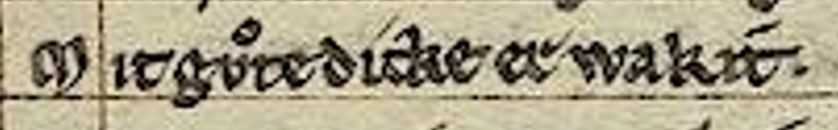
Mit gv°ote dicke er wakit.
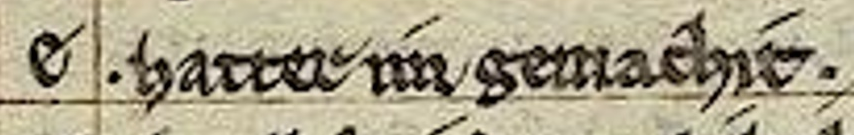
E. hatter im gemachit.
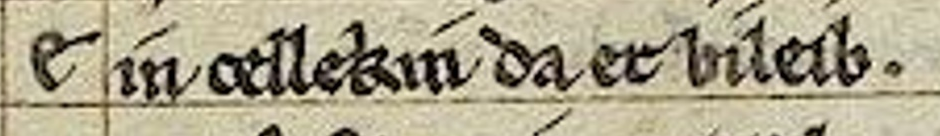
Ein cellekin da er bileib.
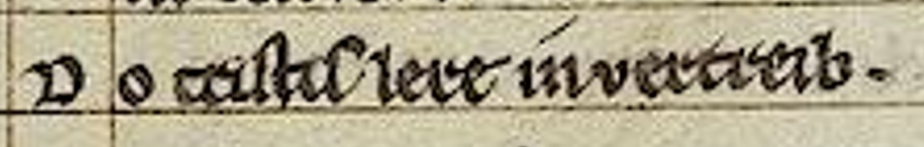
Do criſtiſ lere in vertreib.
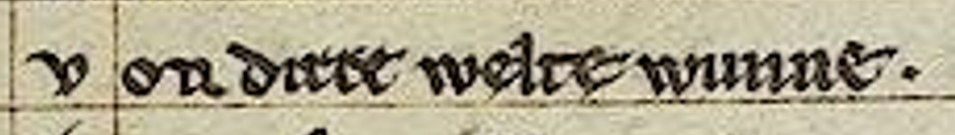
Von dirre welte wunne.
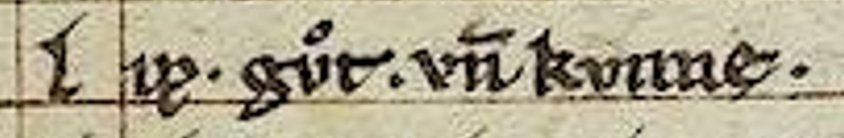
Lip. gv°ot. vn(d) kvnne.
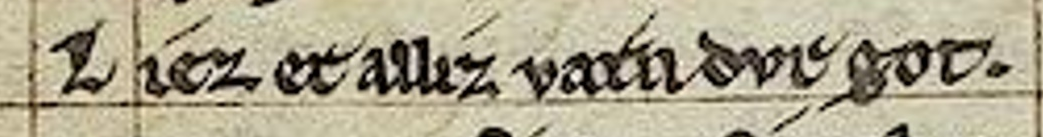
Liez er alliz varn dvr got.
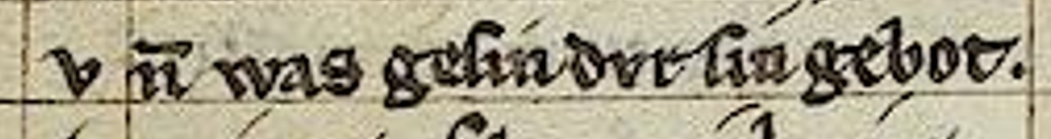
Vn(d) was geſin dvr ſin gebot.
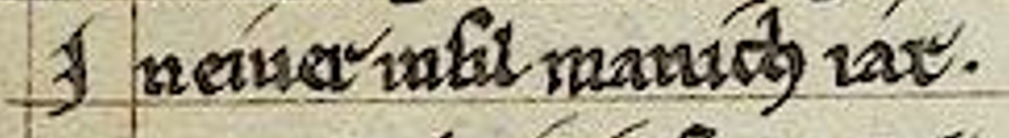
In einer inſil manich iar.
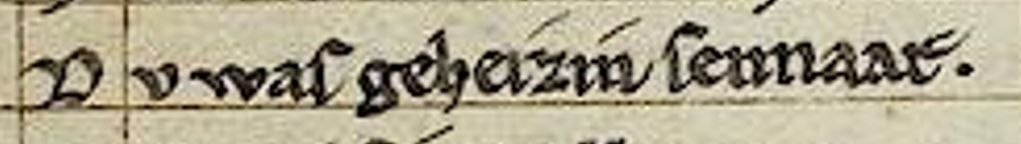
Dv waſ geheizin ſennaar.
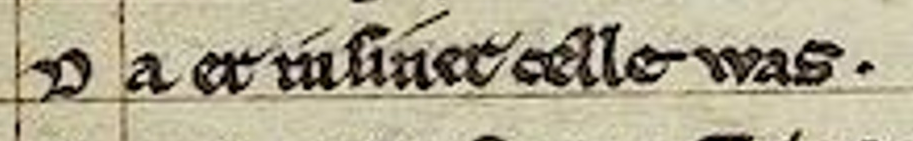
Da er in ſiner celle was.
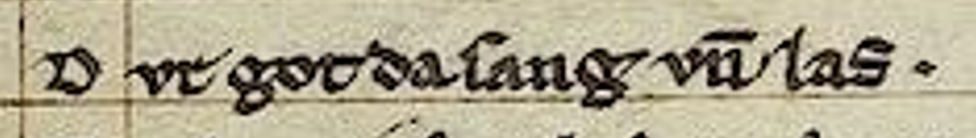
Dvr got da ſang vn(d) las.
